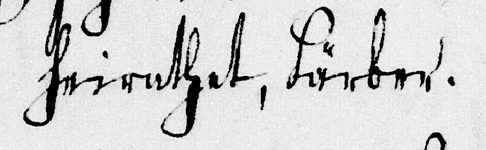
heirathet, Färber.
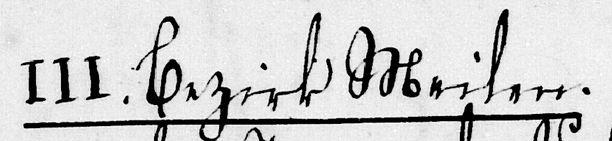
III. Bezirk Meilen.
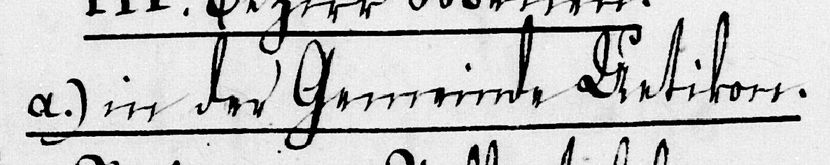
a.) in der Gemeinde Uetikon.
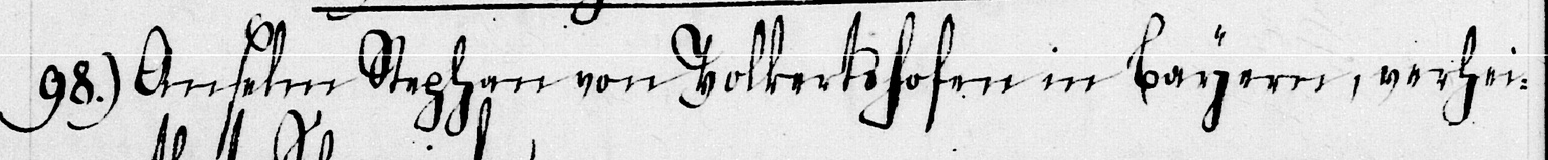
98.) Anselm Stephan von Volkertshofen in Bayern, verhei¬
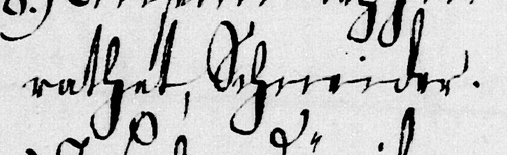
rathet, Schneider.
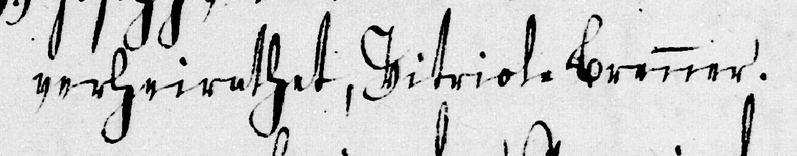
verheirathet, Vitriol-Brenner.
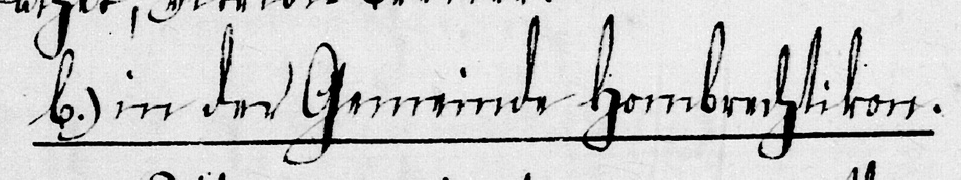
b.) in der Gemeinde Hombrechtikon.
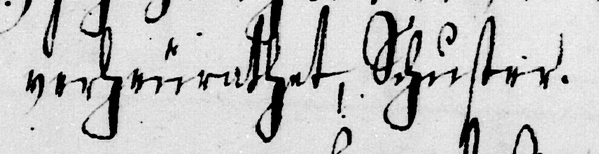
verheurathet, Schuster.
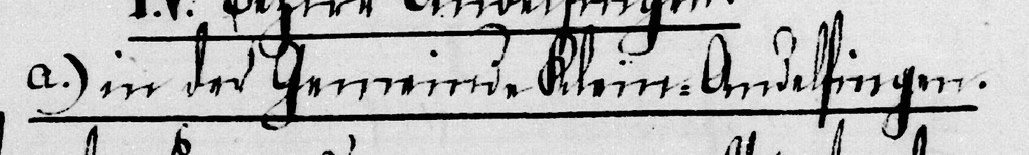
a.) in der Gemeinde Klein-Andelfingen.
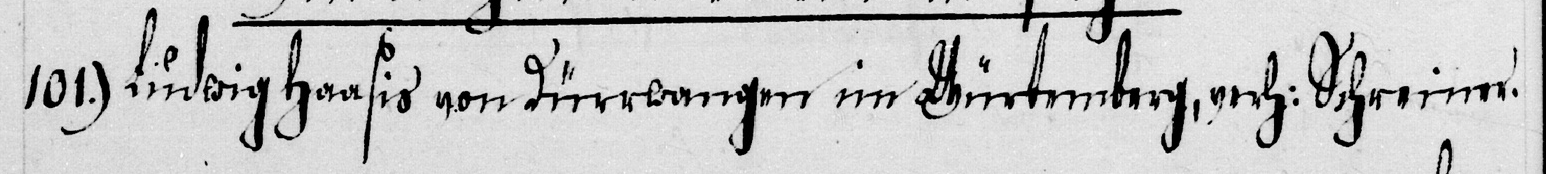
101.) Ludwig Haasis von Dürrwangen im Würtemberg, verh: Schreiner.
